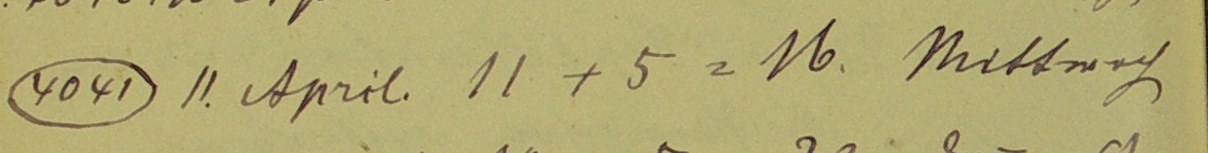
4041 11. April = 11 + 5 = 16. Mittwoch
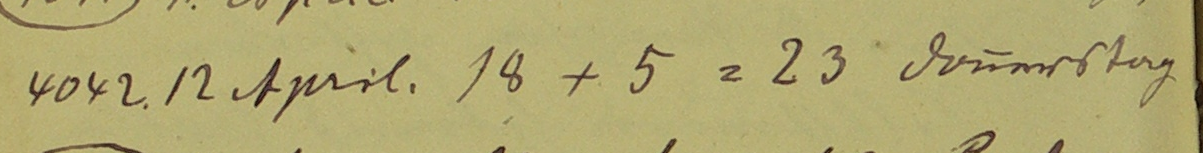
4042 12. April = 18 + 5 = 23. Donnerstag
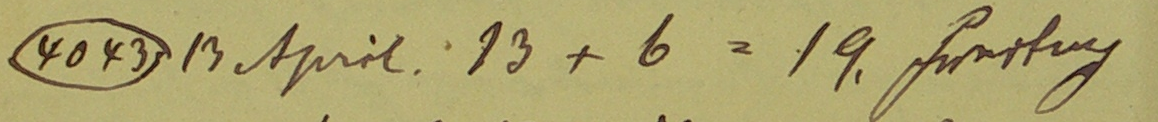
4043 13. April = 13 + 6 = 19. Freitag
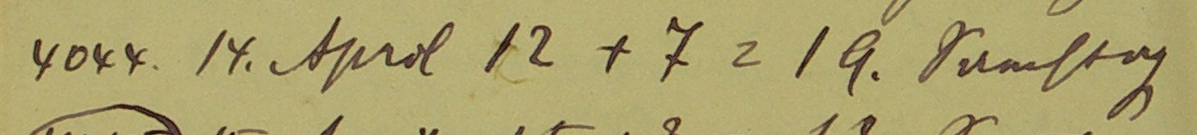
4044 14. April = 12 + 7 = 19. Samstag
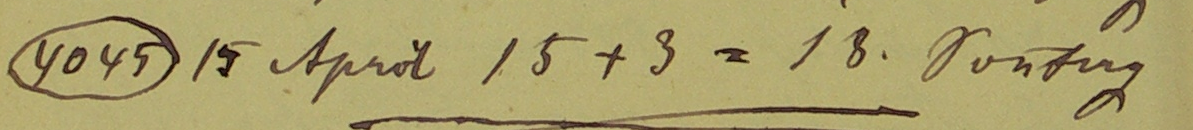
4045 15. April = 15 + 3 = 18. Sonntag
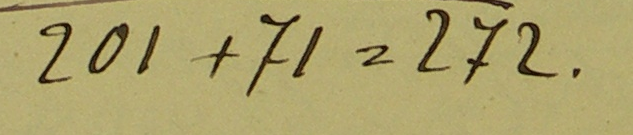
201 + 71 = 272
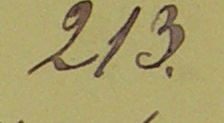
213
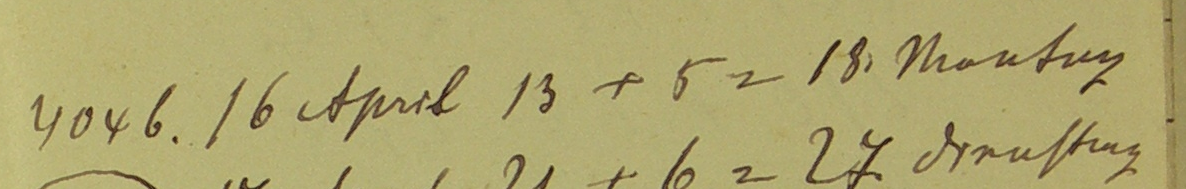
4046 16. April = 13 + 5 = 18. Montag
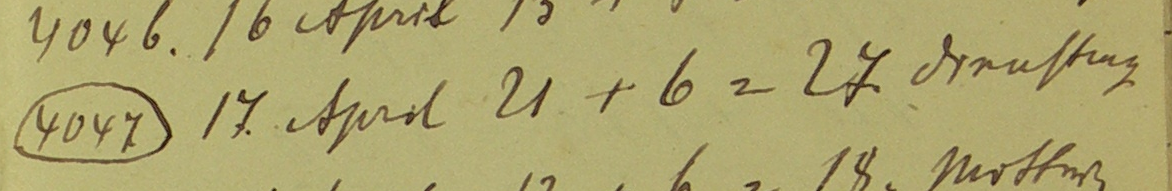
4047 17. April = 21 + 6 = 27.Dienstag
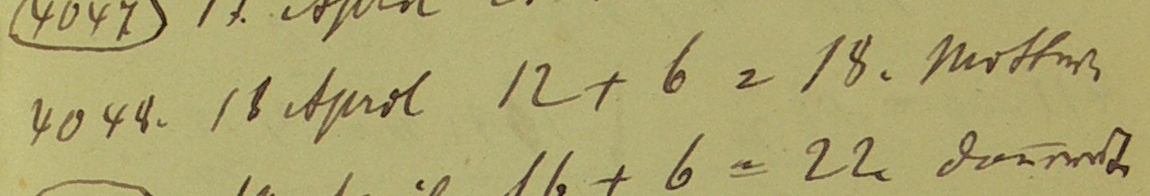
4048 18. April = 12 + 6 = 18. Mittwoch
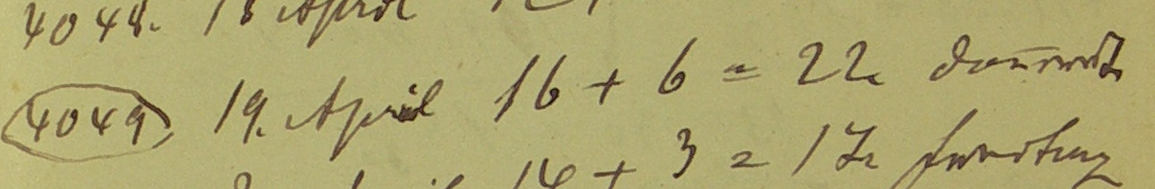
4049 19. April = 16 + 6 = 22. Donnerstag
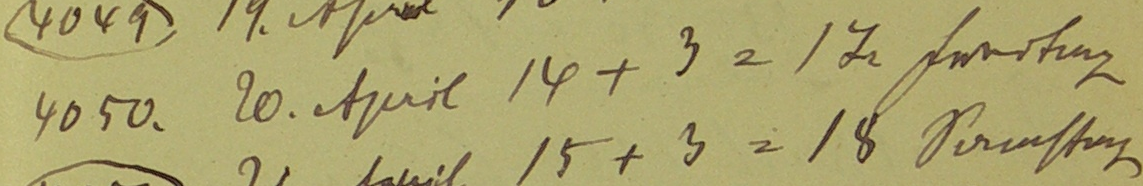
4050 20. April = 14 + 3 = 17. Freitag
